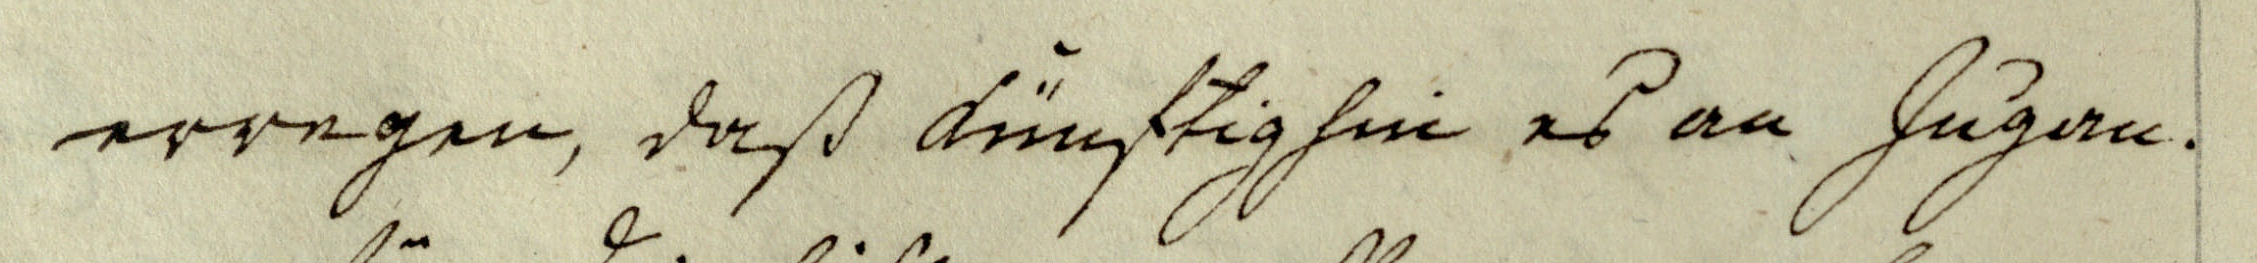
erregen, daß künftighin es an Zugan¬
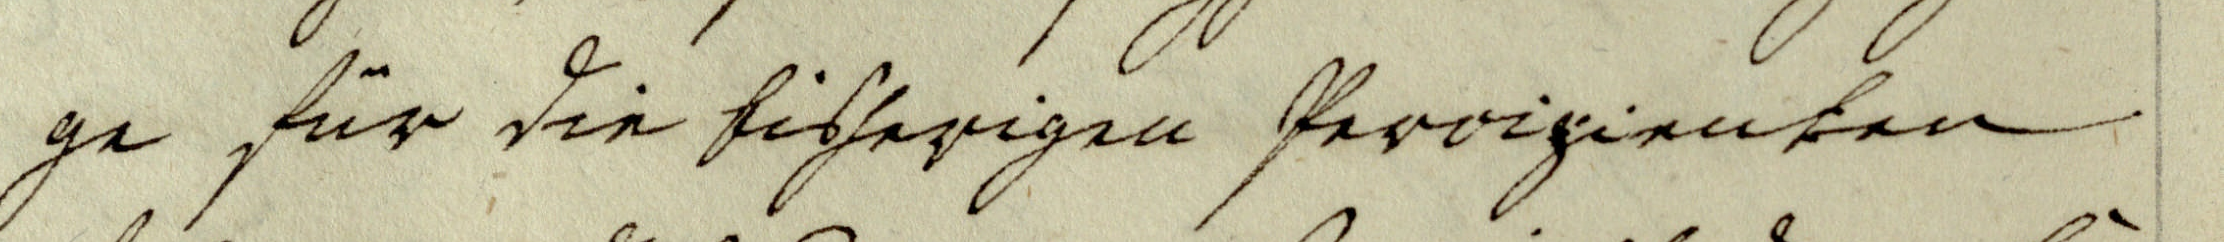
ge für die bisherigen Percipienten
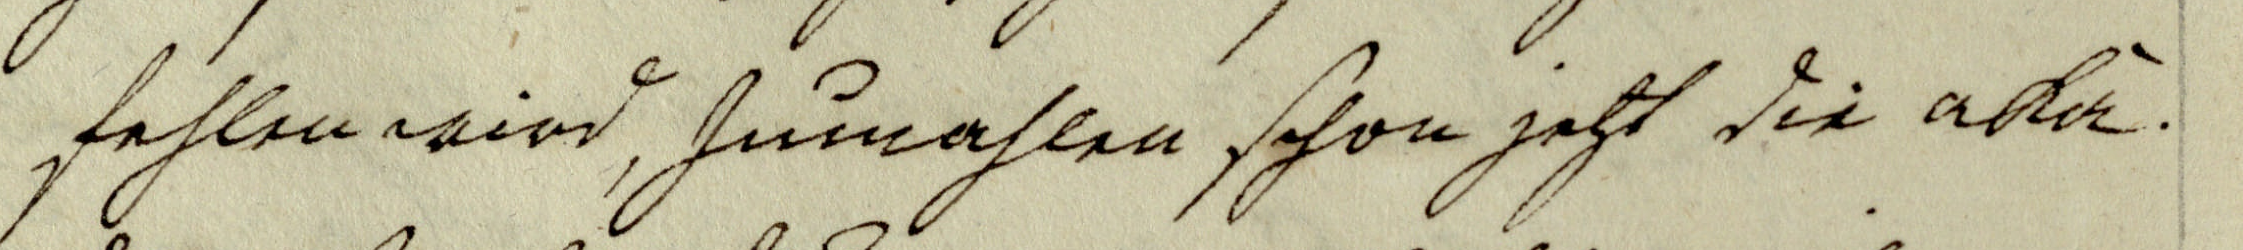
fehlen wird, zumahlen schon jetzt die aka¬
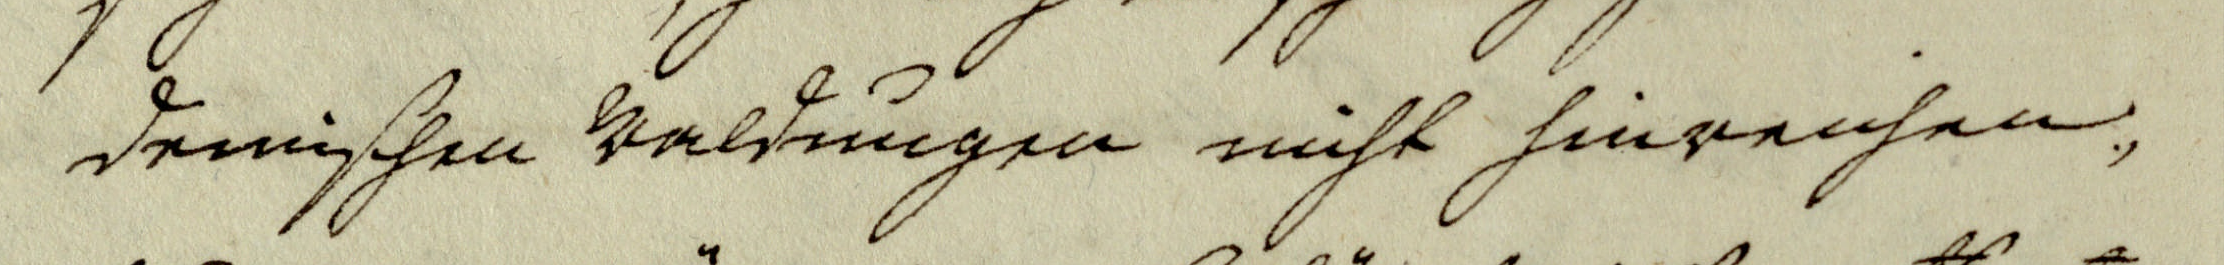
demischen Waldungen nicht hinreichen,
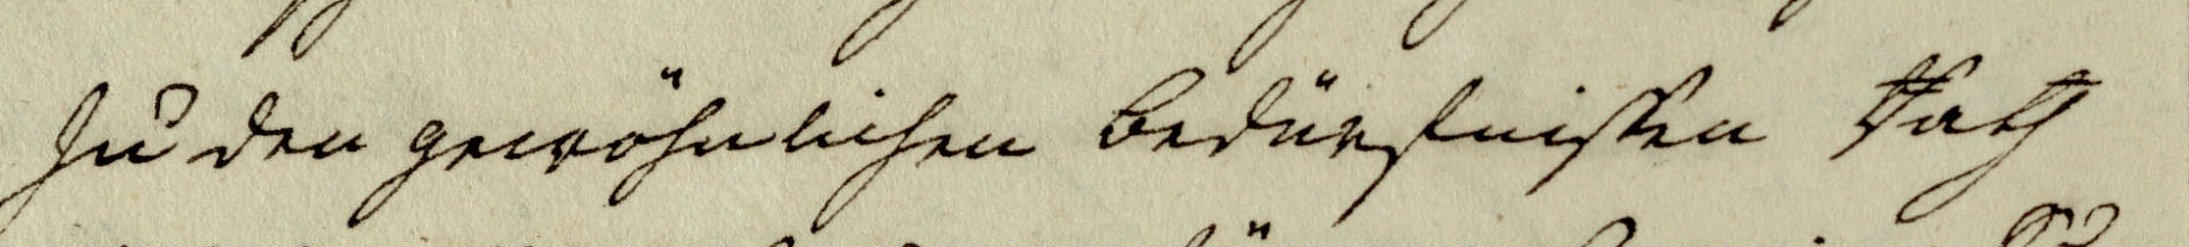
zu den gewöhnlichen Bedürfnissen Rath
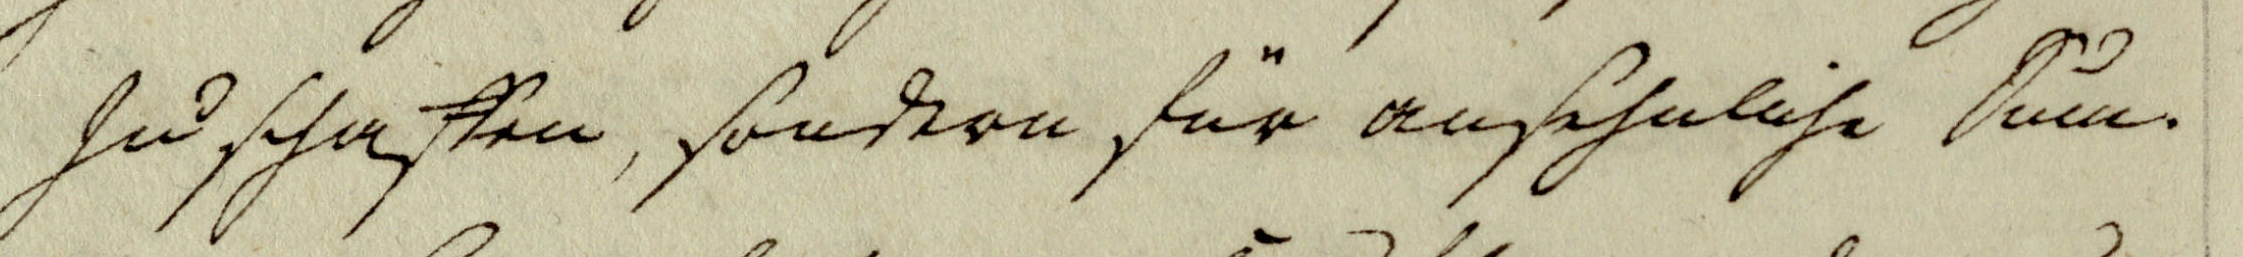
zu schaffen, sondern für ansehnliche Sum¬
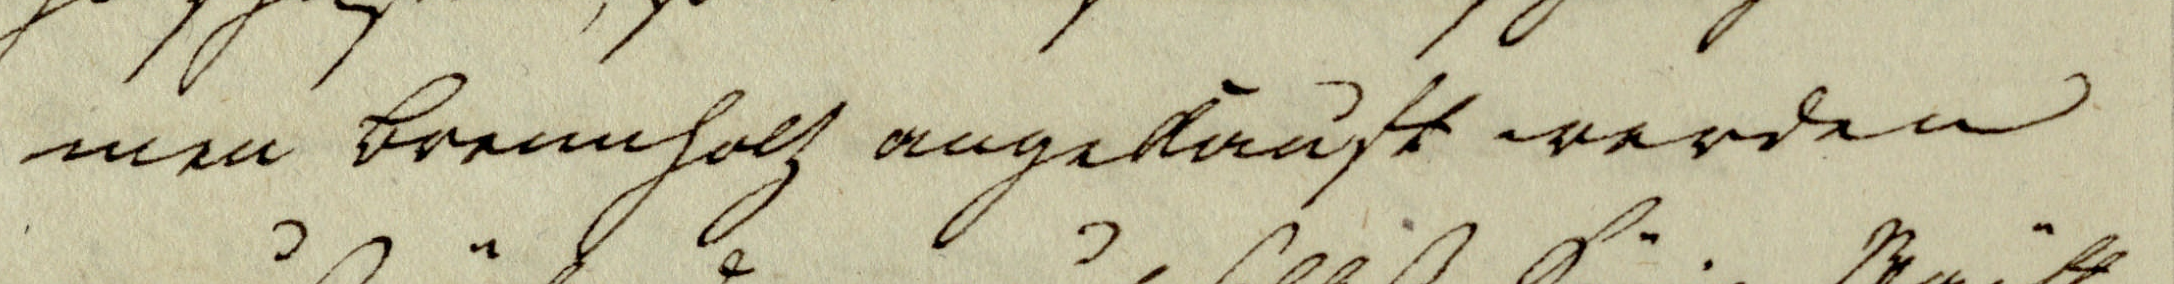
men Brennholz angekauft werden
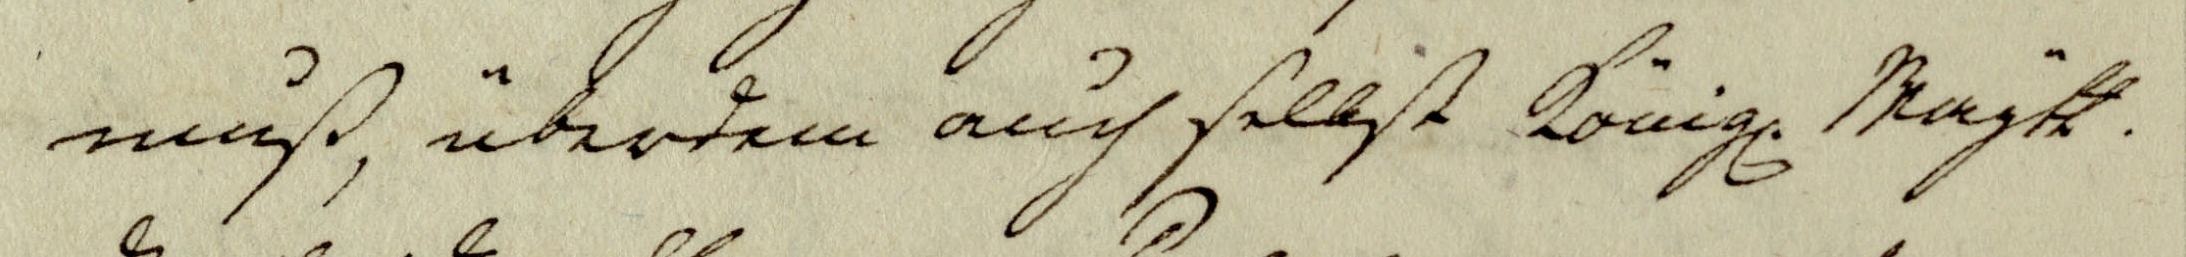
muß, überdem auch selbst Königl. Maÿtt.
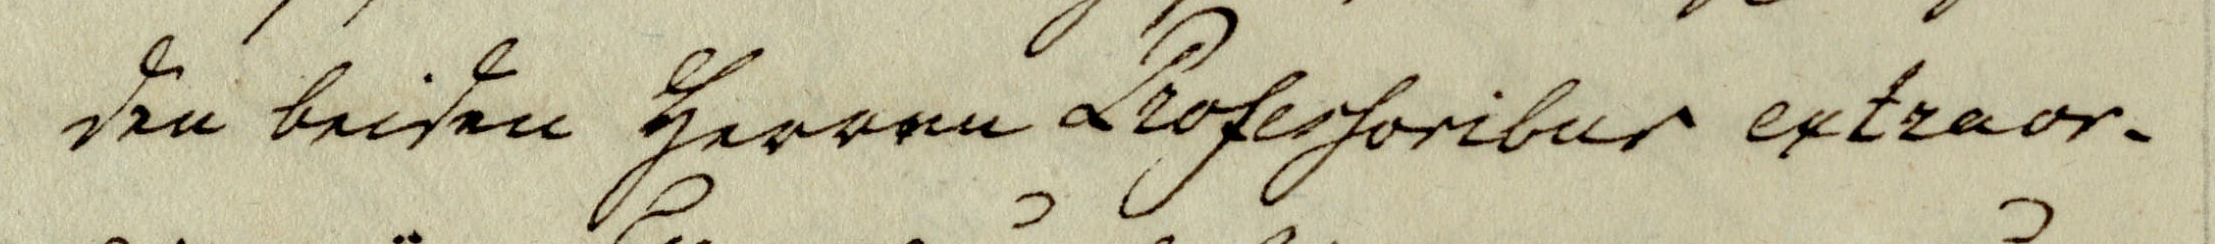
den beiden Herrenn Professoribus extraor¬
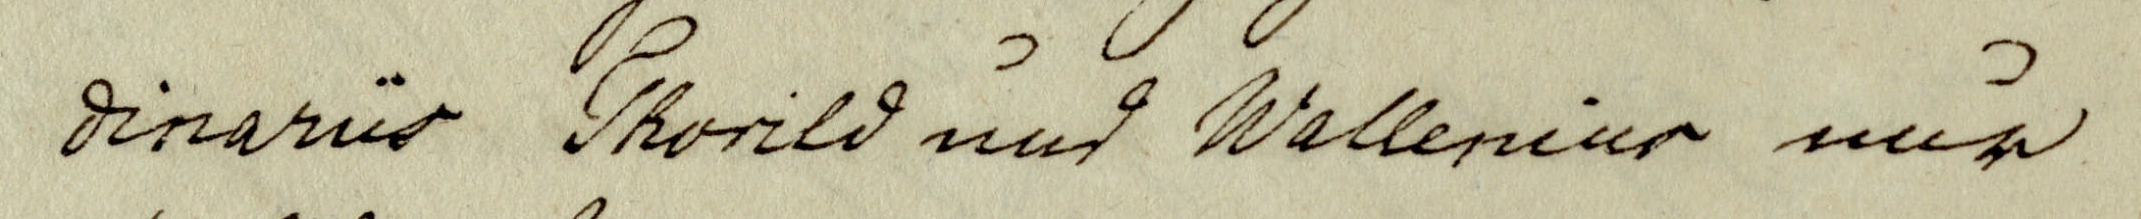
dinariis Thorild und Wallenius nur
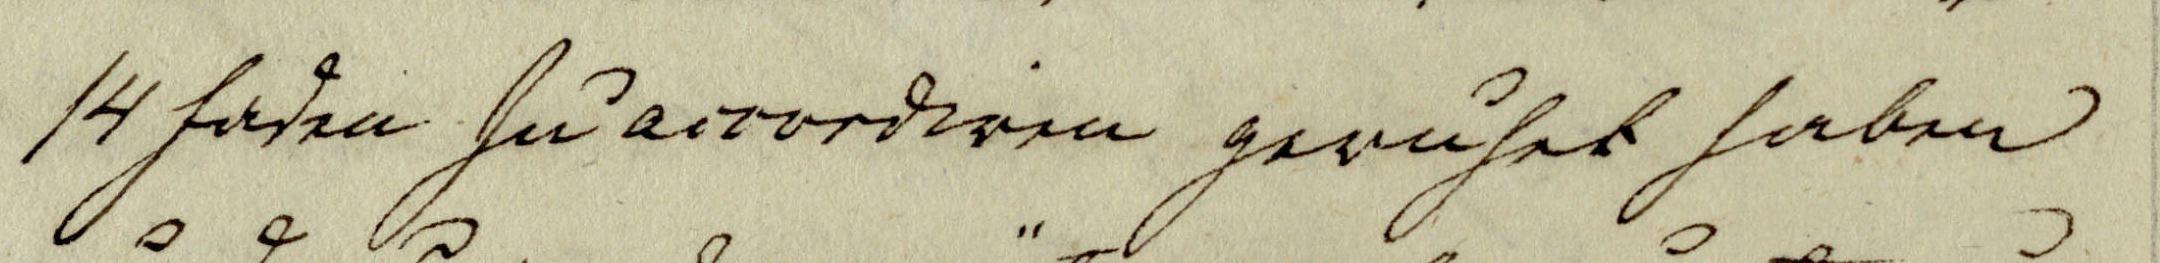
14 Faden zu accordiren geruhet haben
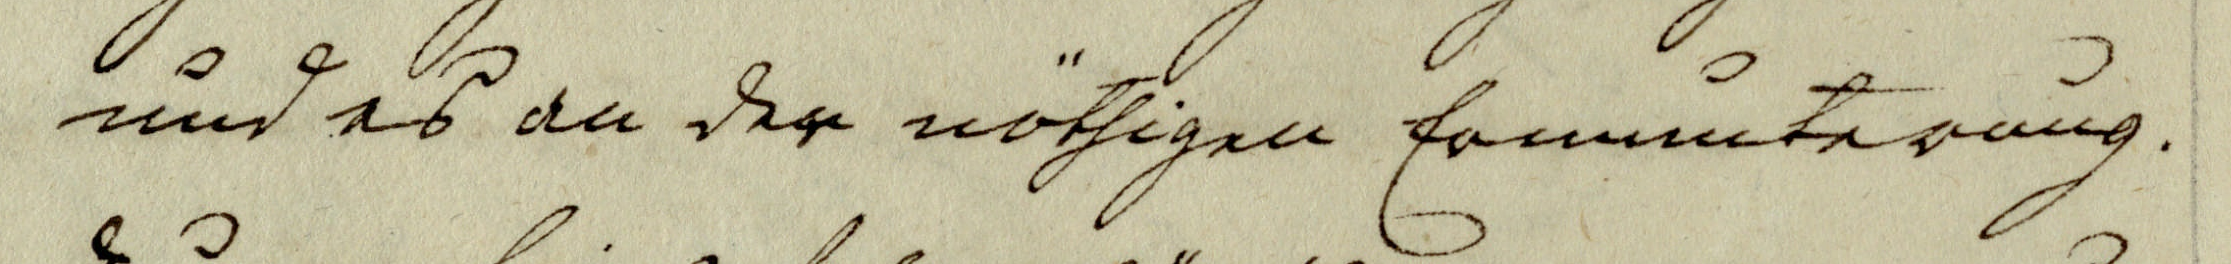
und es an der nöthigen Ermunterung.
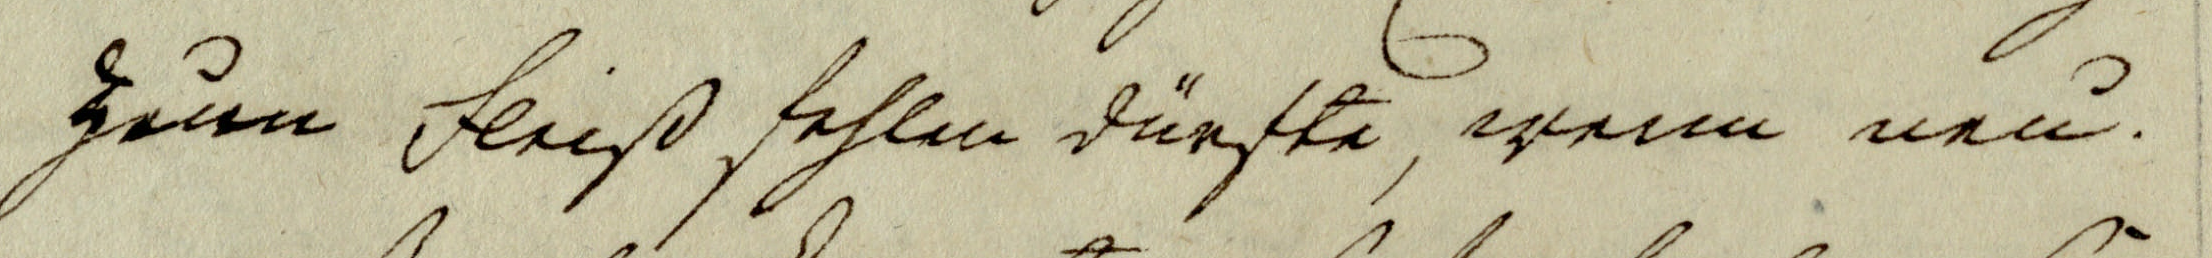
zum Fleiß fehlen dürfte, wenn neu¬
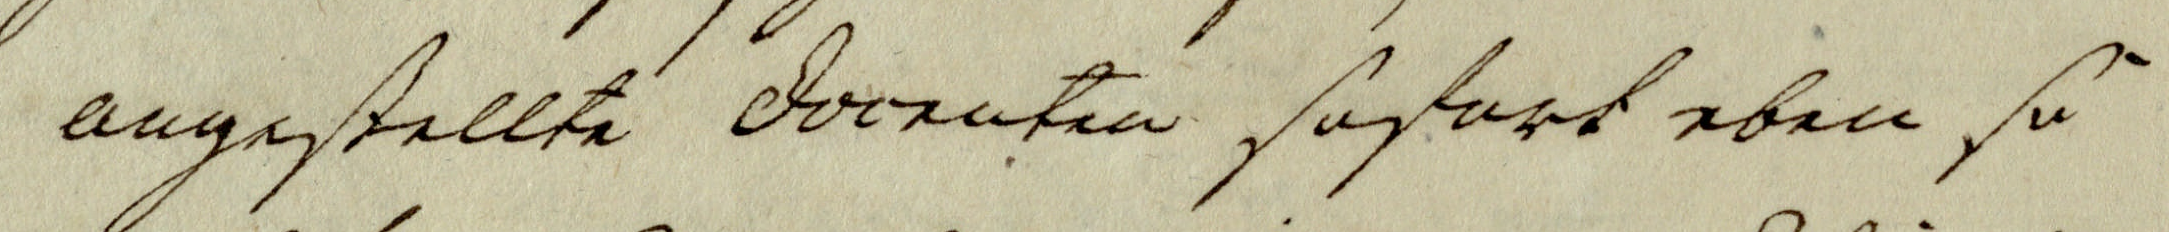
angestellte Docenten sofort eben so
